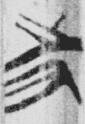寺（待）
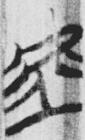○（乎）
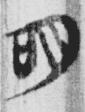名
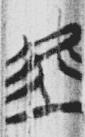○（乎）
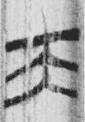夫
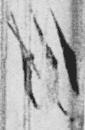川
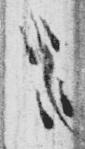水
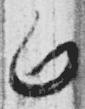㠯（以）
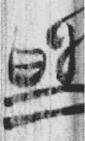爲
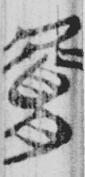膚
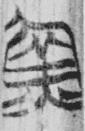魚
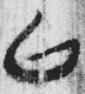㠯（以）
